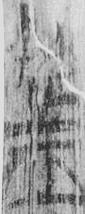箸
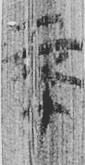不
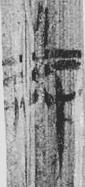與
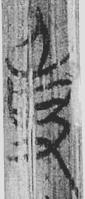事
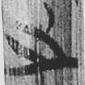之
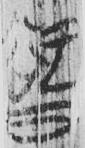智（知）
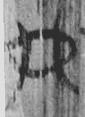四
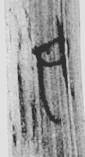海
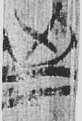至
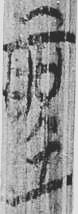聖（聽）
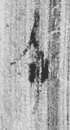千
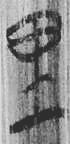里
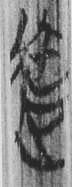達
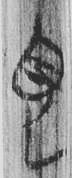見
